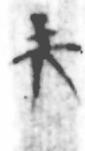夫
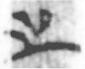之
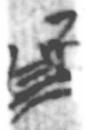爲
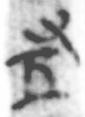○（右）
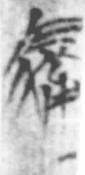○（服）
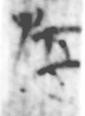○（左）
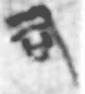司
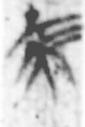馬
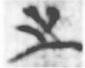之
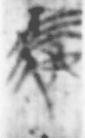駟
